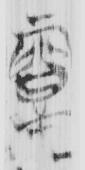{雨旱}
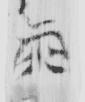雨
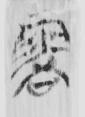{雨各}
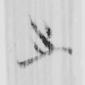之
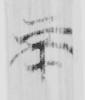不
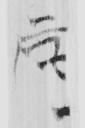厇
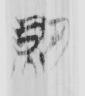則
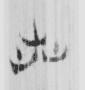芔
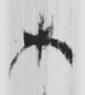木
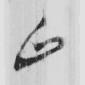㠯（以）
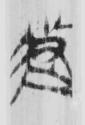﨤
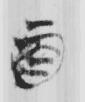百
